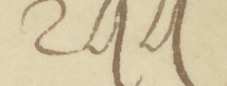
244
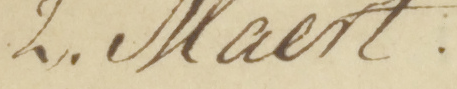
2. Maert.
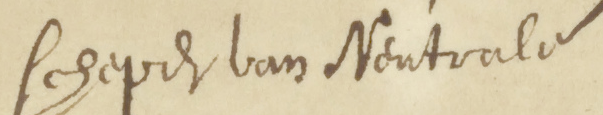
schepen van Neutrale
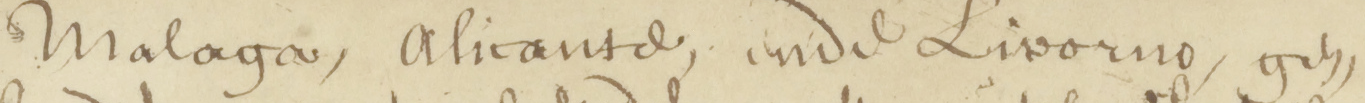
Malaga, Alicante, ende Livorno, ge„
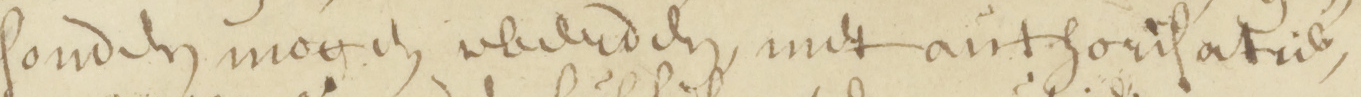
sonden mogen werden, met authorisatie,
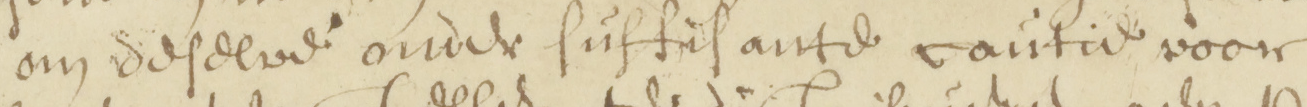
om deselve onder suffisante cautie voor
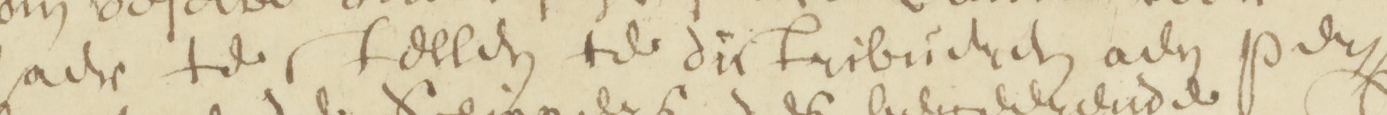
haer te stellen te distribueren aen Per„
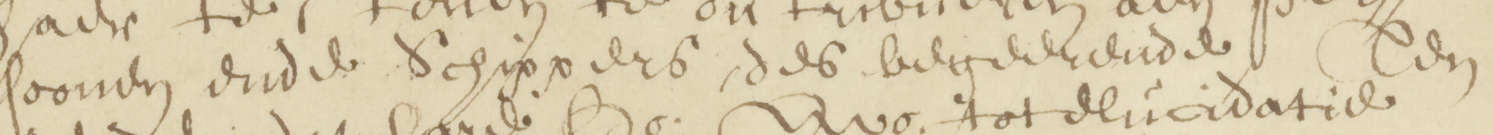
soonen ende Schippers, des begeerende, Ten
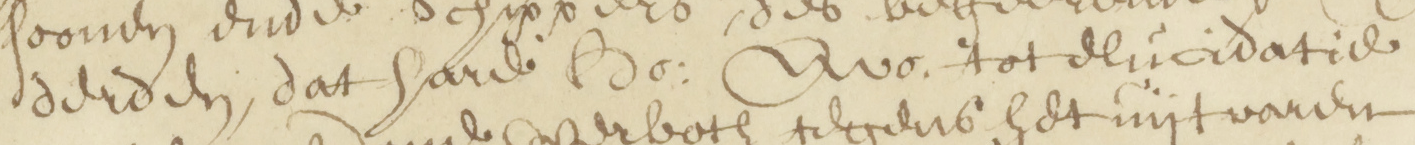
derden, dat hare Ho:Mo: tot elucidatie
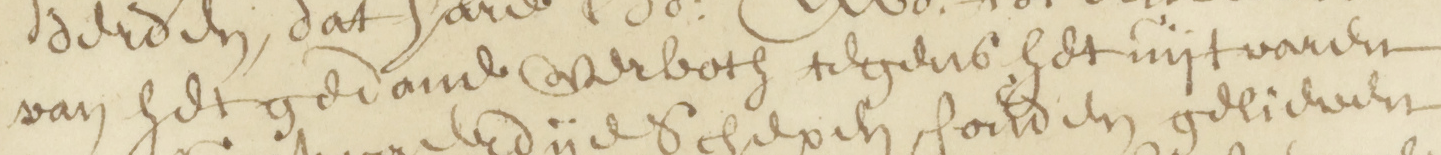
van het gedane Verboth tegens het uijtvaren
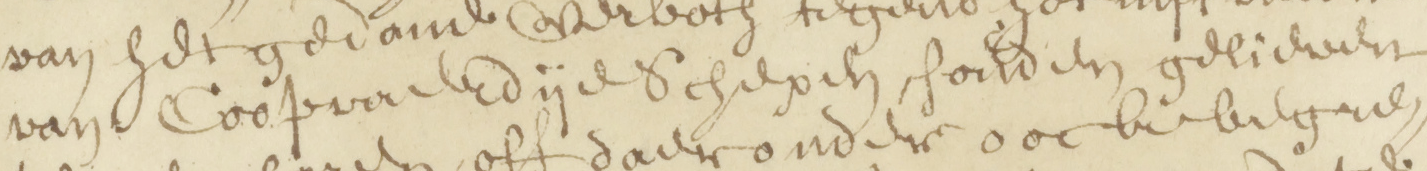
van Coopvaerdije Schepen, souden gelieven
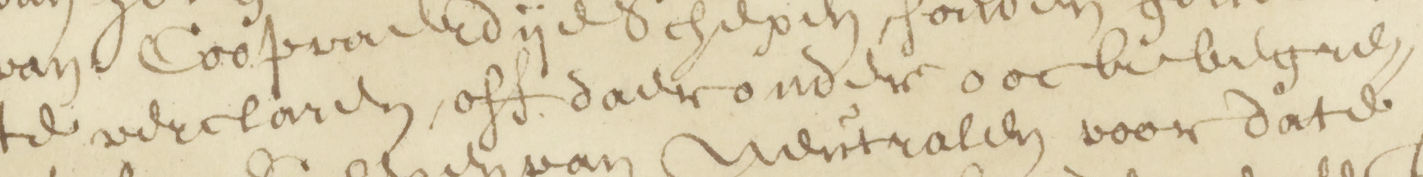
te verclaren, oft daeronder oock begre„
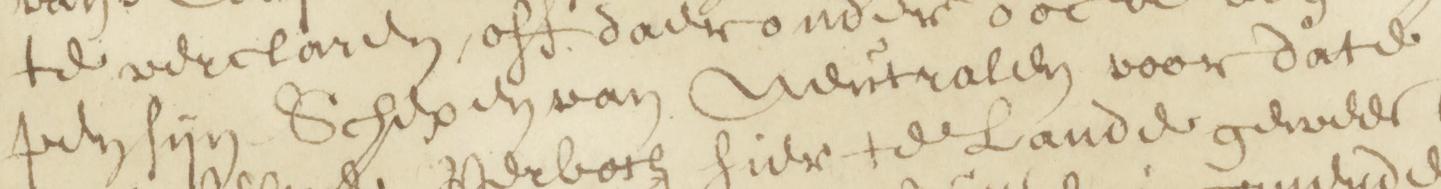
pen sijn Schepen van neutralen voor date
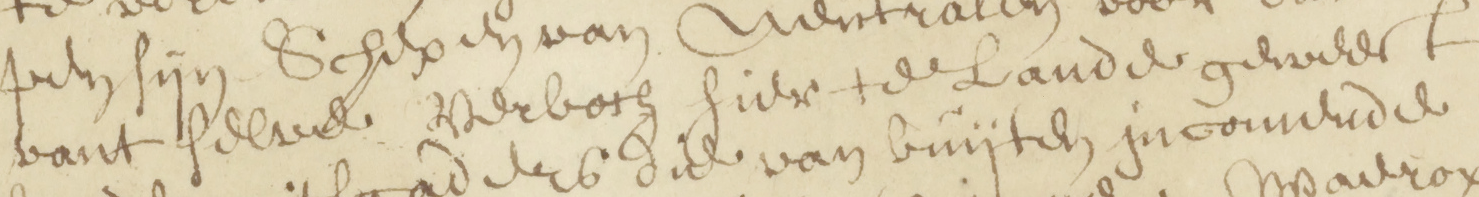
vant selve Verboth hier te Lande geweest
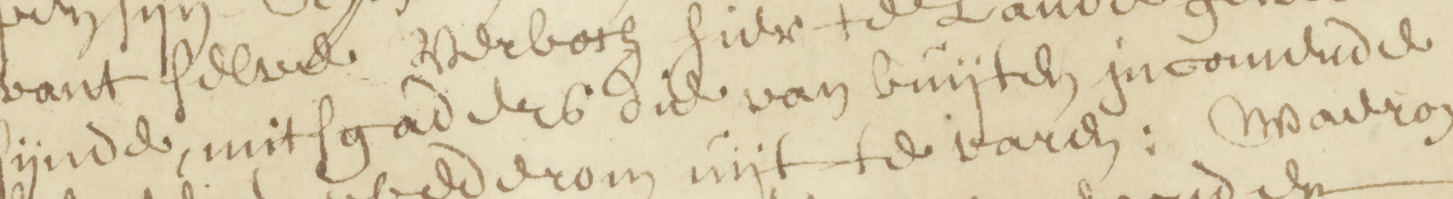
sijnde, mitsgaders die van buijten incomende
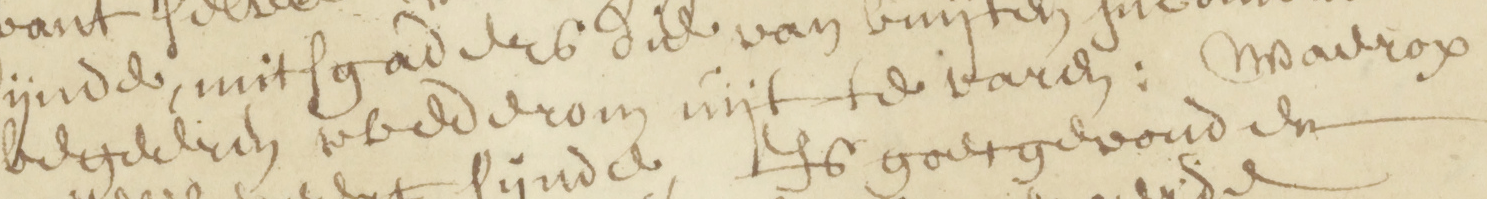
begeeren wederom uijt te varen: Waerop
